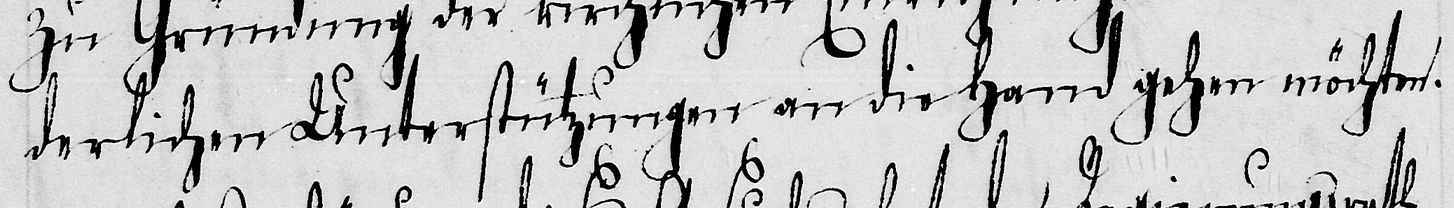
derlichen Unterstützungen an die Hand gehen möchten.
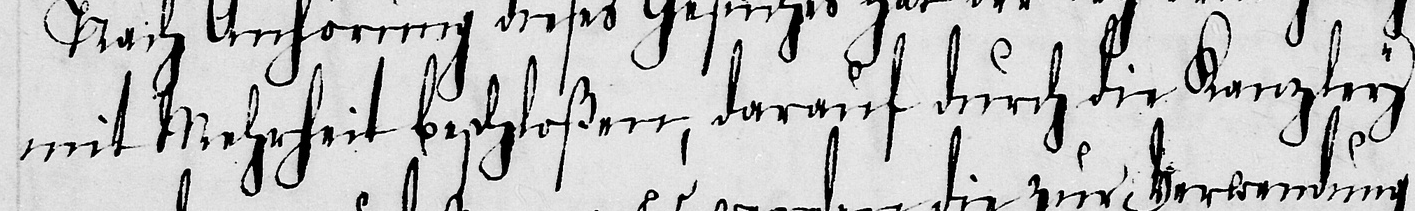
mit Mehrheit beschloßen, darauf durch die Kanzley
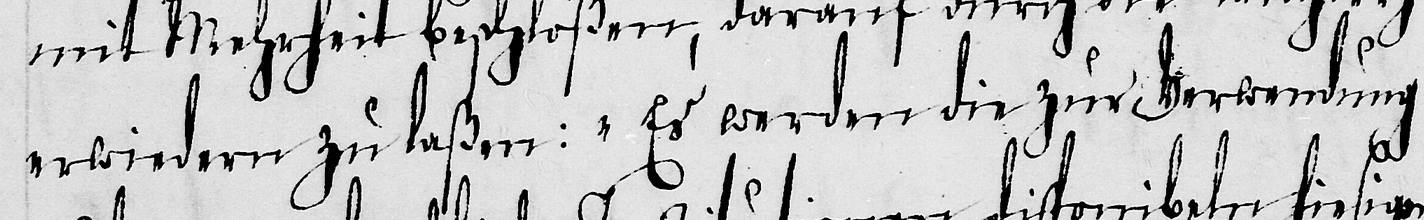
erwiedern zu laßen: „Es werden die zur Verwendung
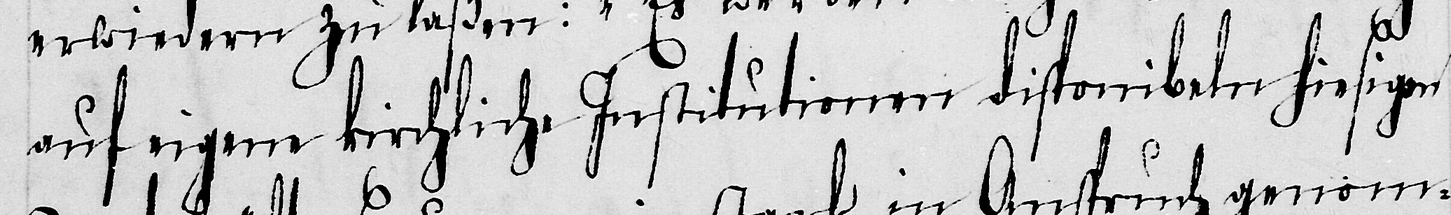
auf eigene kirchliche Institutionen disponibeln hiesigen
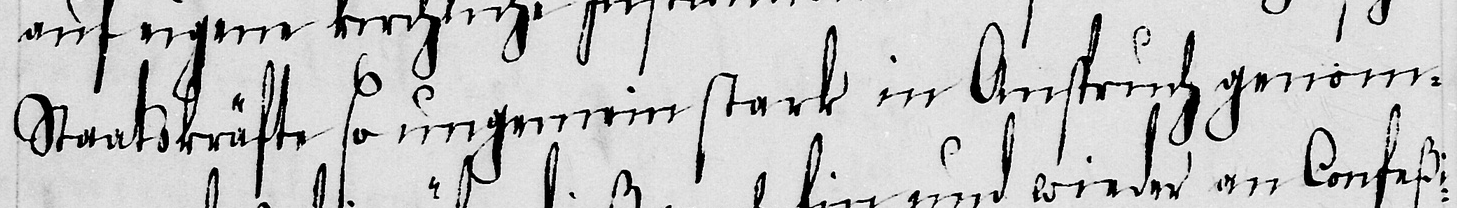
Staatskräfte so ungemein stark in Anspruch genom¬
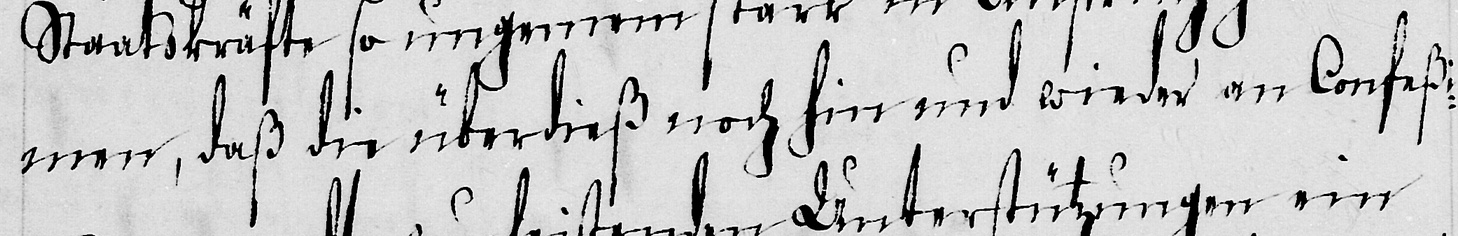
men, daß die überdieß noch hin und wieder an Confeßi¬
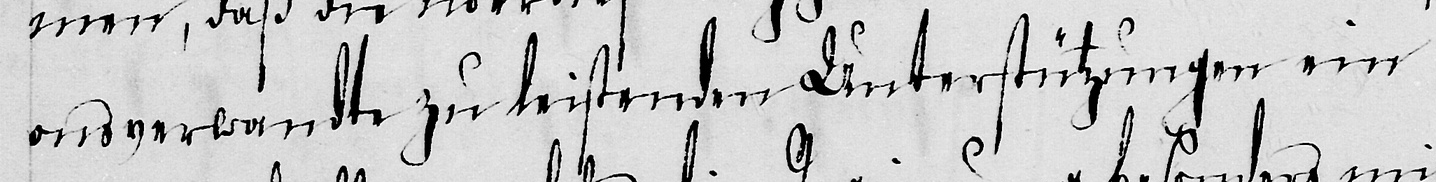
onsverwandte zu leistenden Unterstützungen ein
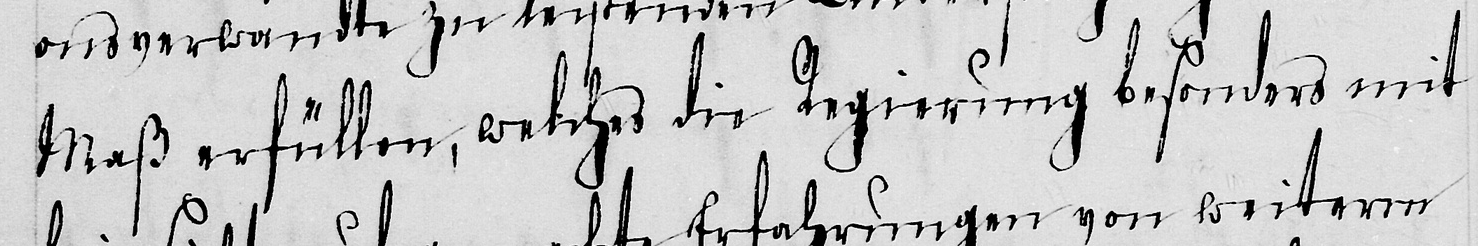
Maß erfüllen, welches die Regierung besonders mit
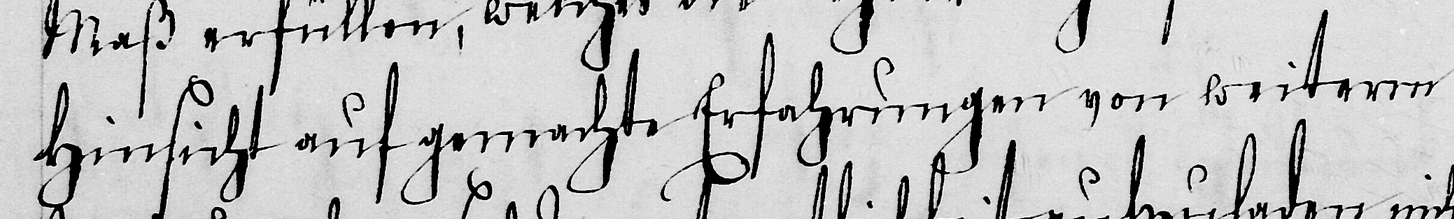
Hinsicht auf gemachte Erfahrungen von weiterm
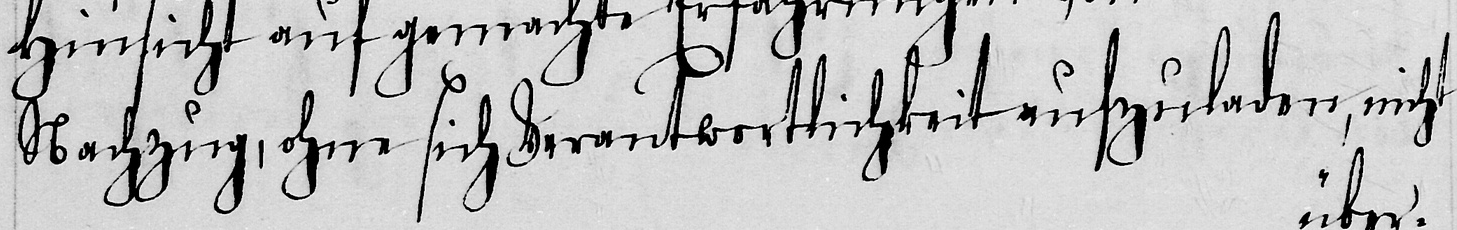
Nachzug, ohne sich Verantwortlichkeit aufzuladen, nicht
